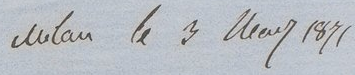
Milan le 3 Mars 1871
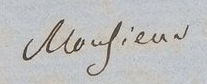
Monsieur
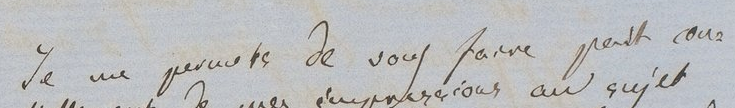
Je me permets de vous faire part con-
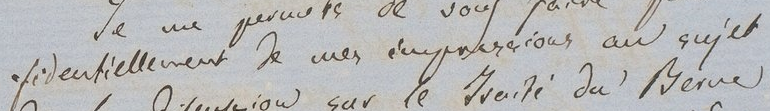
fidentiellement de mes impressions au sujet
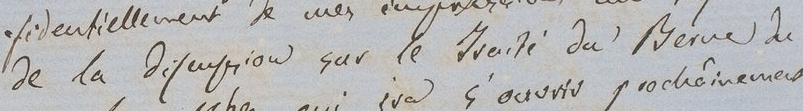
de la discussion sur le Traité du Berne de
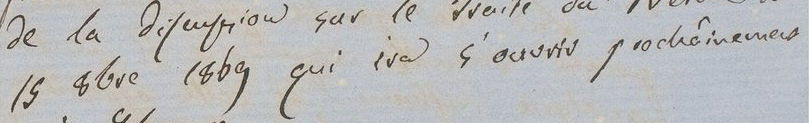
15 8bre 1869 qui ira s'ouvrir prochaînement
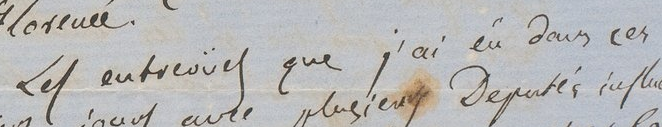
Les entrevues que j'ai eû dans ces
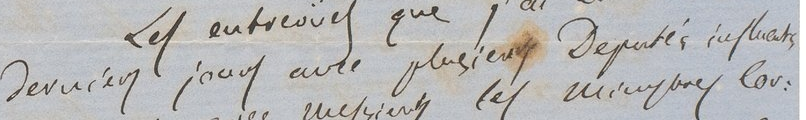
derniers jours avec plusieurs Deputés influents
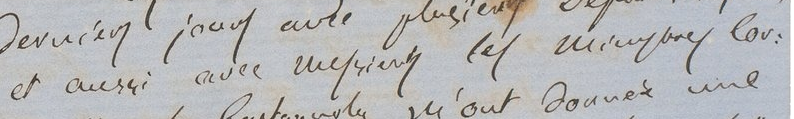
et aussi avec Messieurs les Ministres Cor-
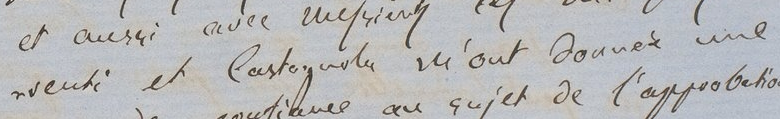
renti et Castagnola m'ont donnée une
